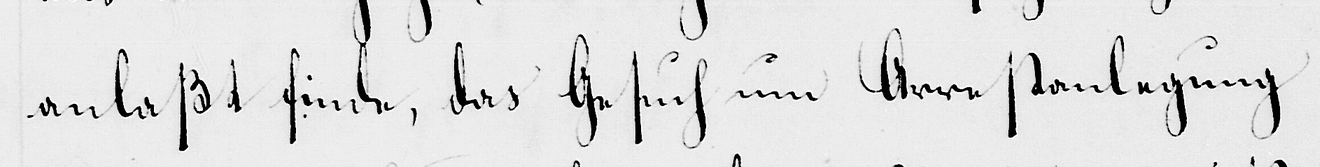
anlaßt finde, das Gesuch um Arrestanlegung
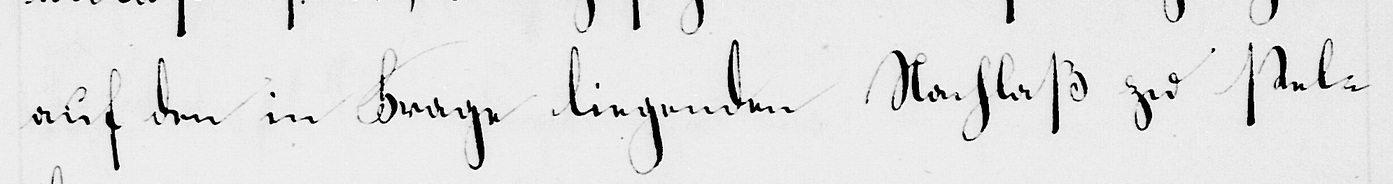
auf den in Frage liegenden Nachlaß zu stel¬
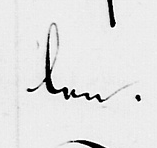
len.
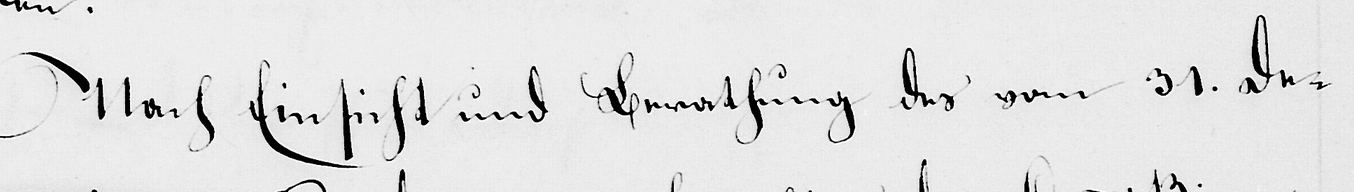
Nach Einsicht und Berathung des vom 31. De¬
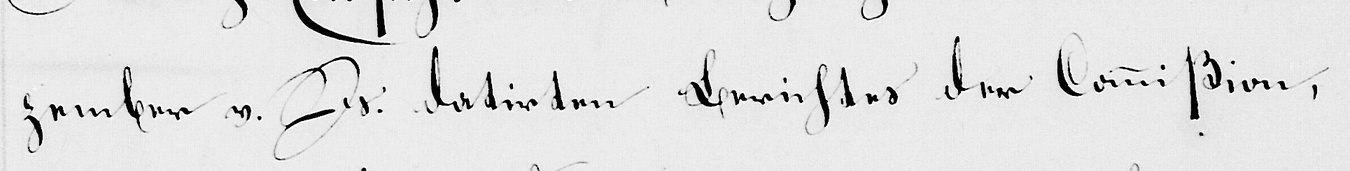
zember v. Js. datirten Berichtes der Commißion,
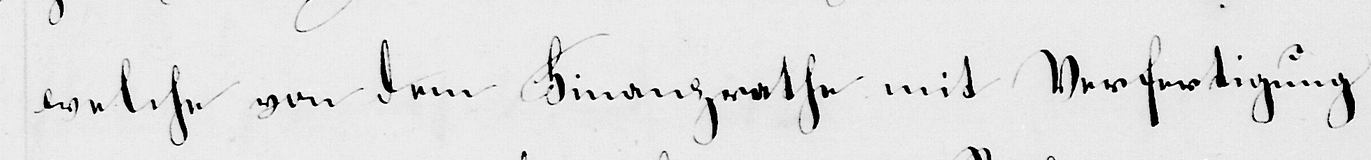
welche von dem Finanzrathe mit Verfertigung
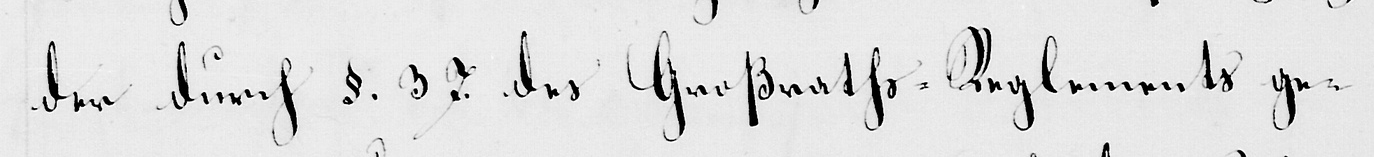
der durch §. 37. des Großraths-Reglements ge¬
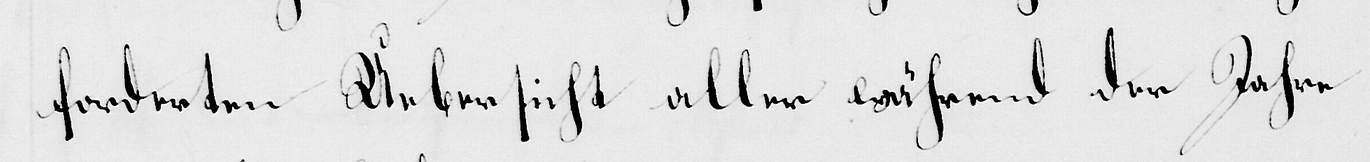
forderten Uebersicht aller während der Jahre
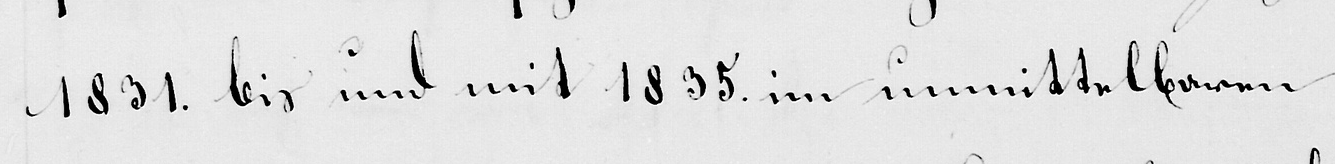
1831. bis und mit 1835. im unmittelbaren
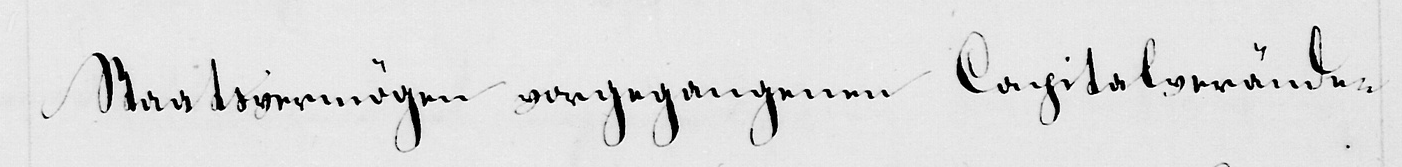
Staatsvermögen vergegangenen Capitalverände-
